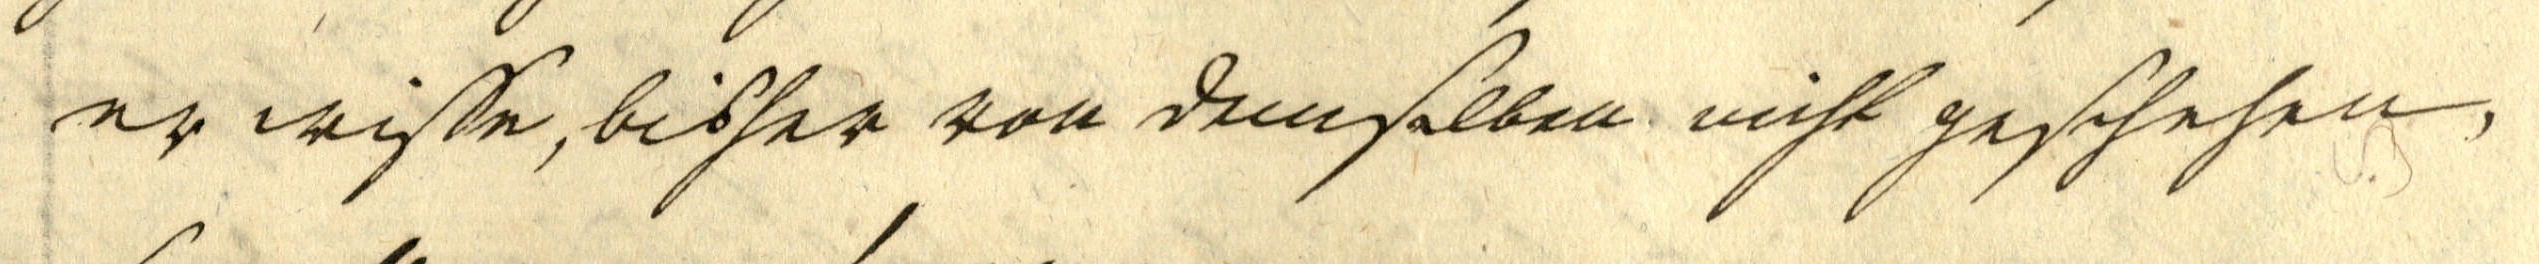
er wisse, bisher von demselben nicht geschehen,
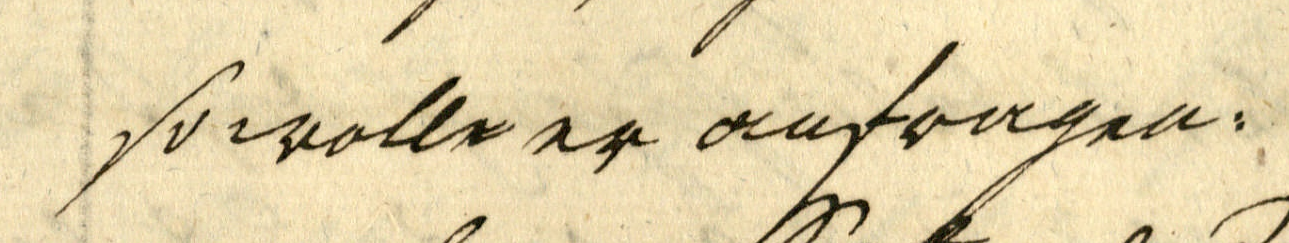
so wolle er anfragen:
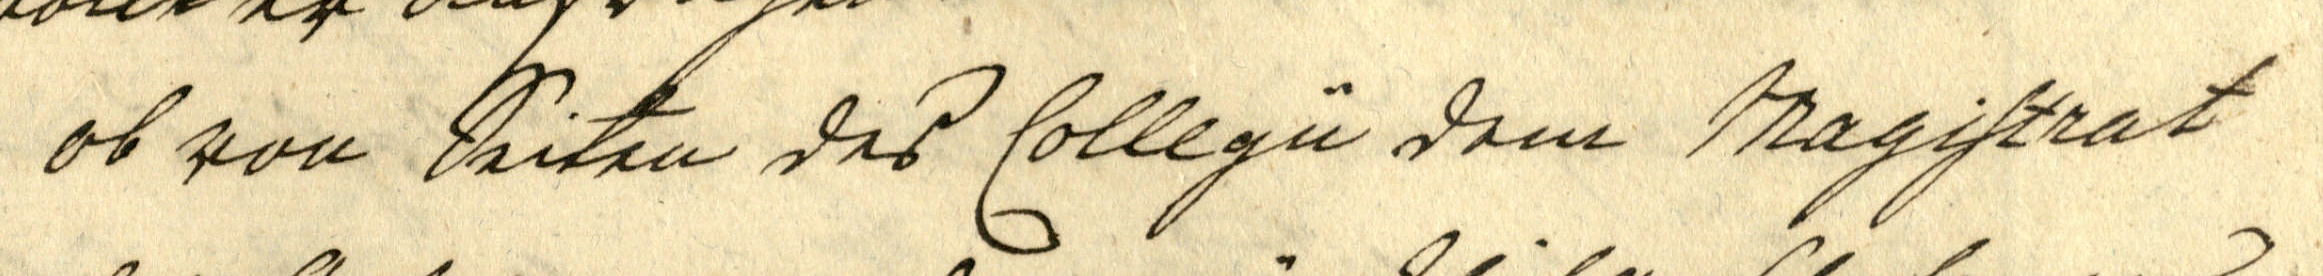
ob von Seiten des Collegii dem Magistrat
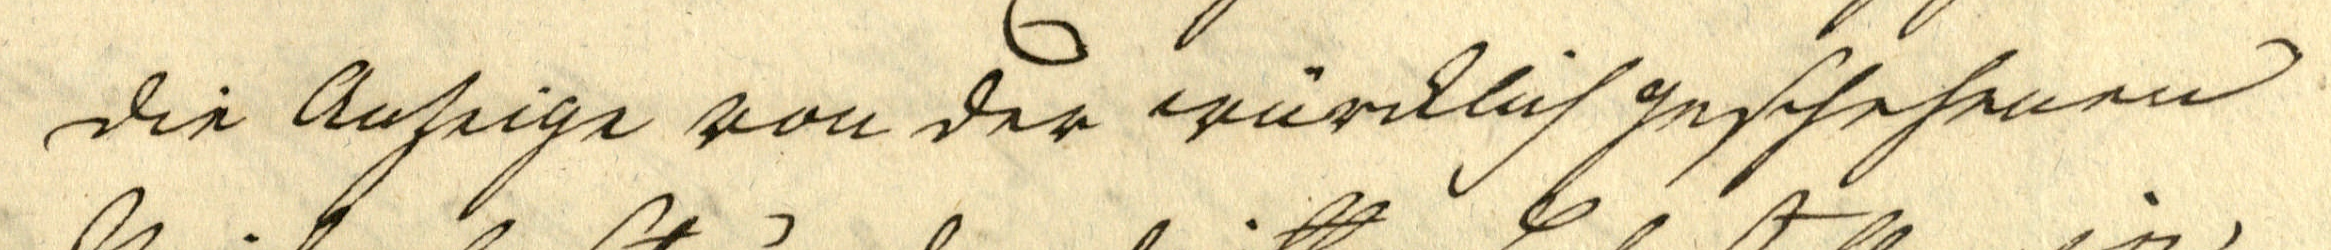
die Anzeige von der würcklich geschehenen
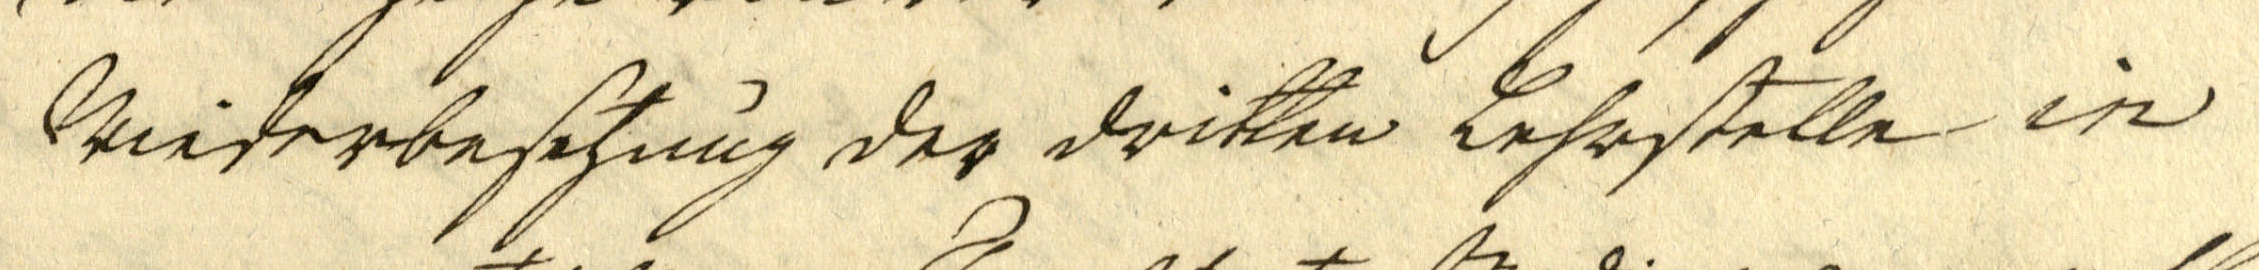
Wiederbesetzung der dritten Lehrstelle in
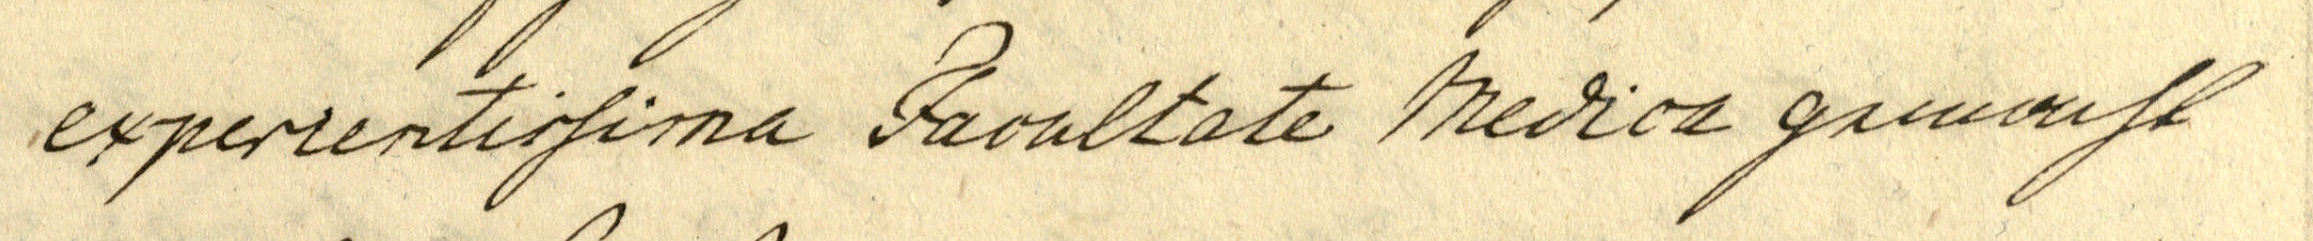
experientissima Facultate Medica gemacht
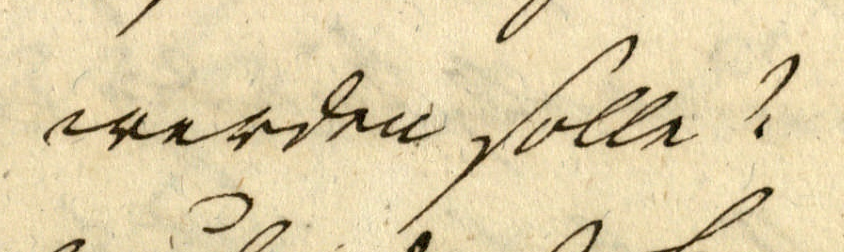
werden solle?
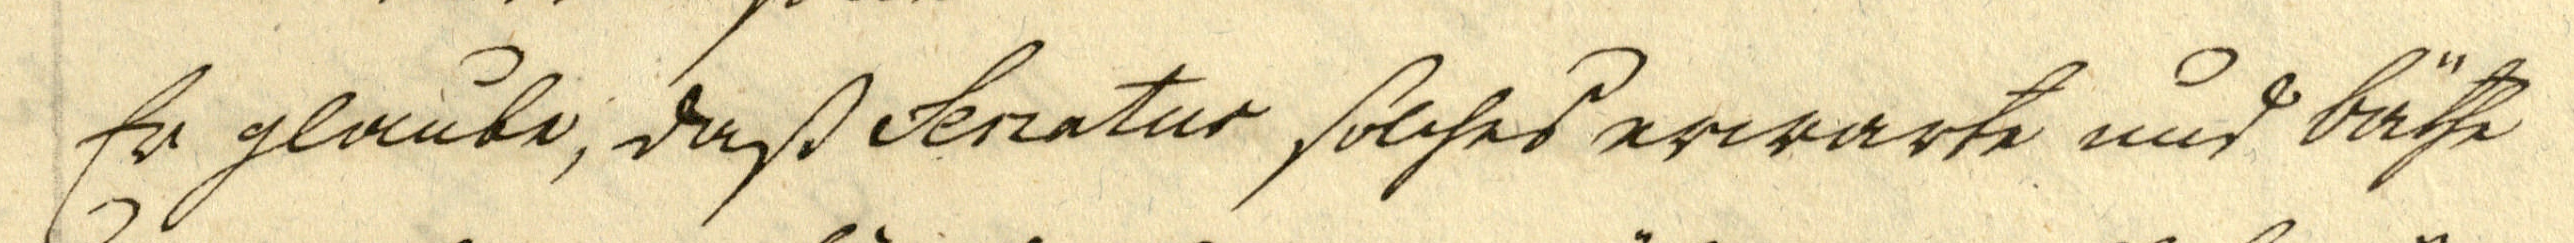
Er glaube, daß Senatus solches erwarte und bäthe
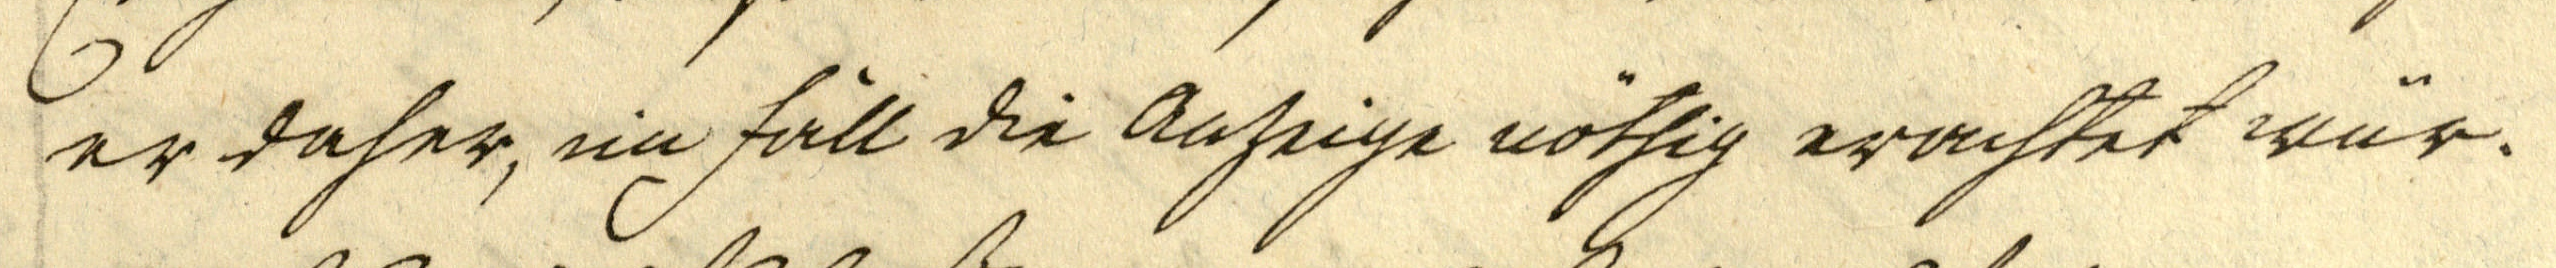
er daher, im Fall die Anzeige nöthig erachtet wür¬
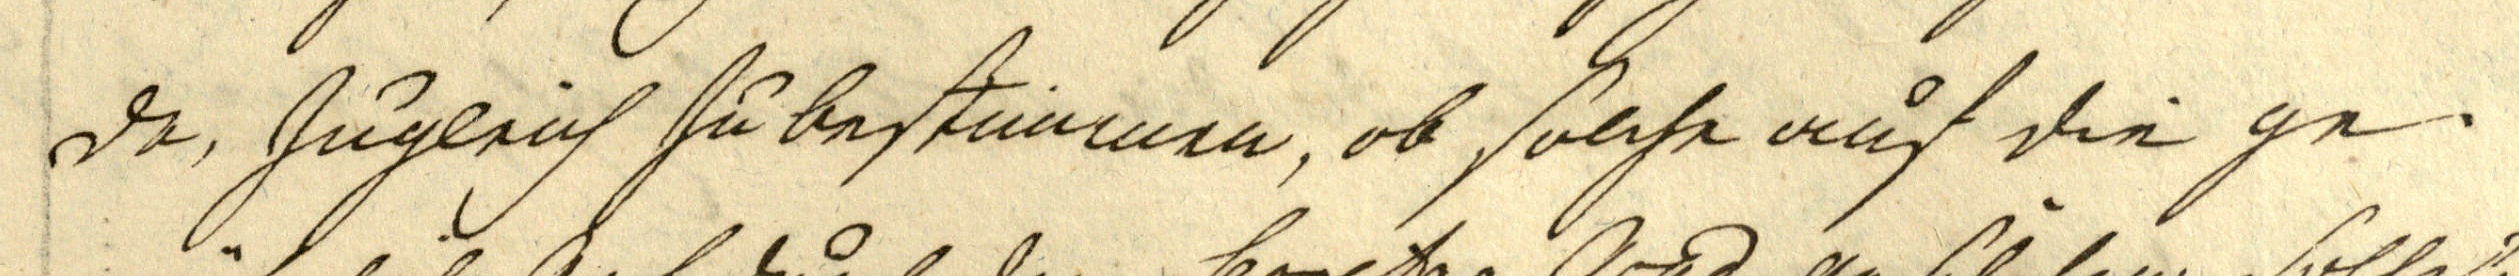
de, zugleich zu bestimmen, ob solche auf die ge¬
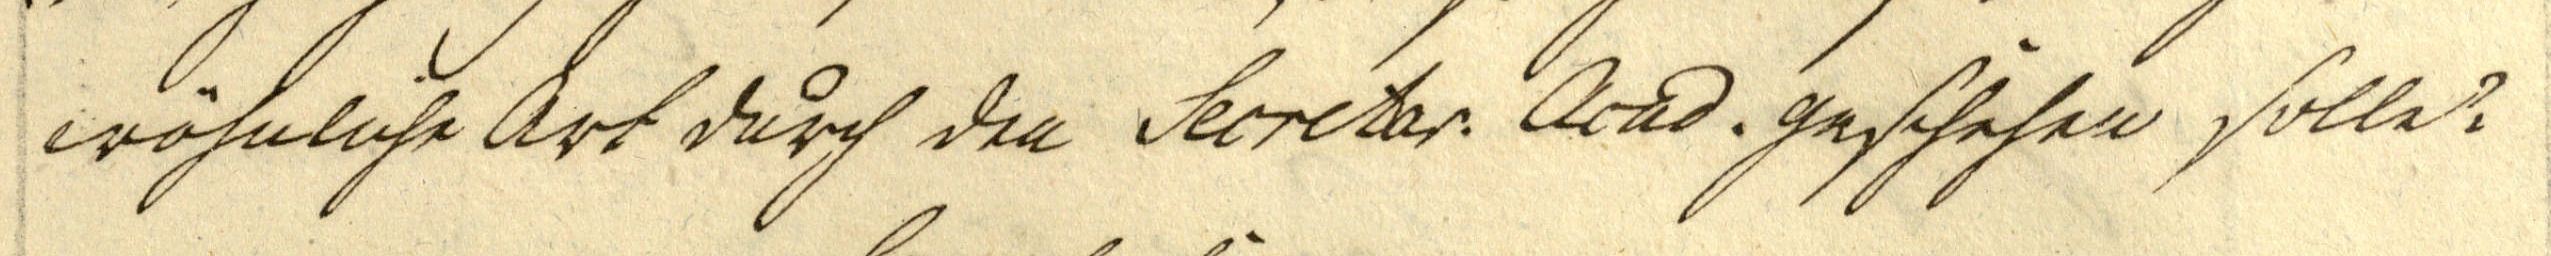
wöhnliche Art durch den Secretar. Acad. geschehen solle?
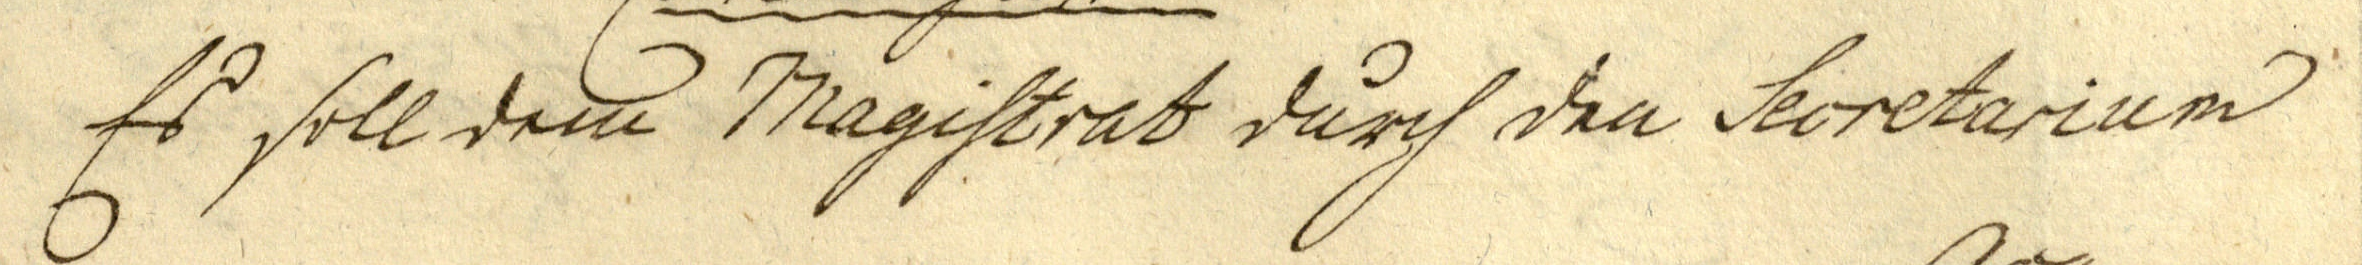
Es soll dem Magistrat durch den Secretarium
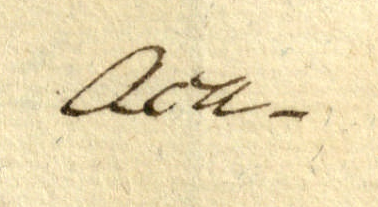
Aca-
